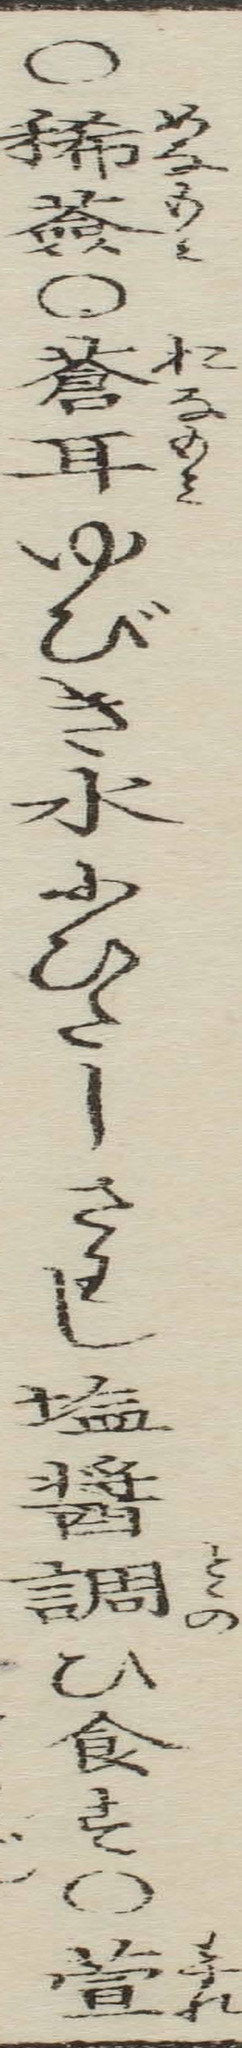○稀薟○蒼耳ゆびき水にひたしさわし塩醤調ひ食す○萱
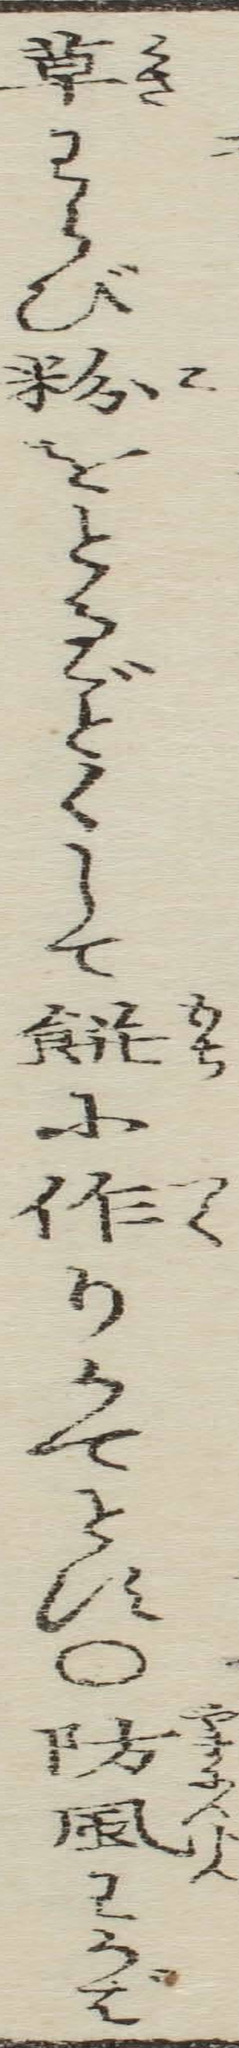草わらび粉をとるごとくして餅に作りかてとす○防風わかば
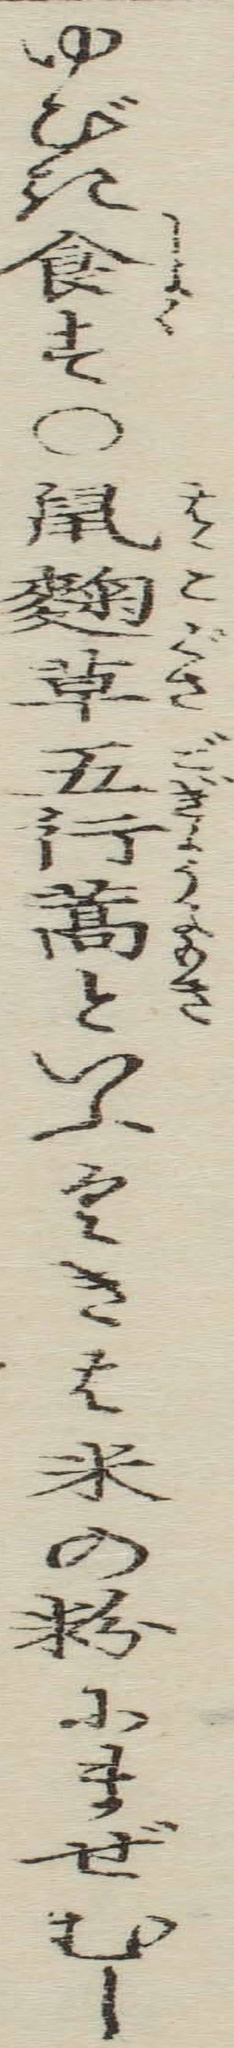ゆびき食す○䑕麹草五行蒿といふくきは米の粉にまぜむし
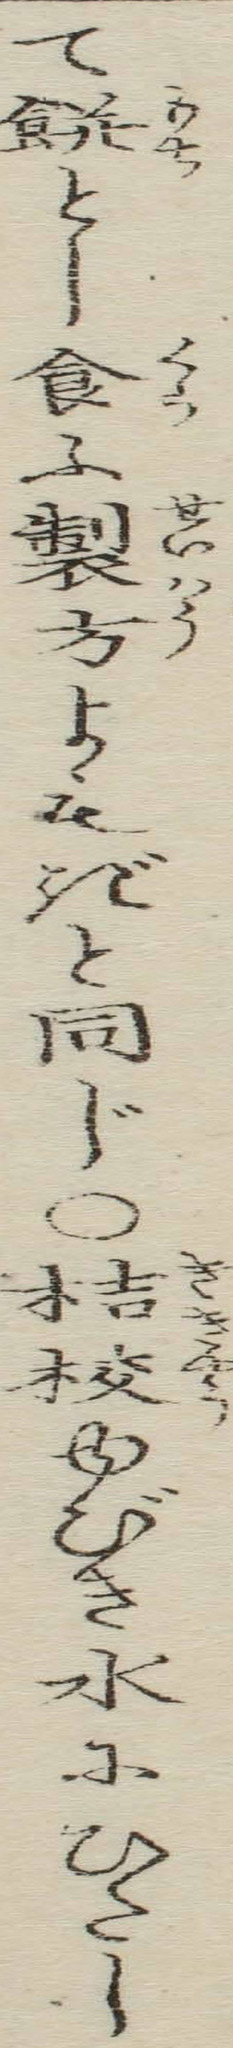て餅とし食ふ製方よもぎと同じ○桔校ゆびき水にひたし

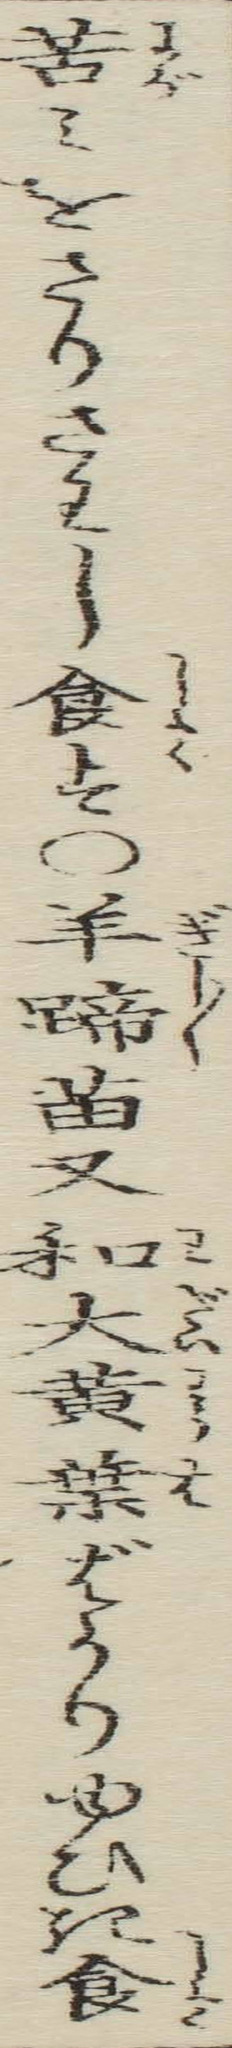苦みをさりさわし食す○羊蹄苗又和大黄葉ばかりゆひき食
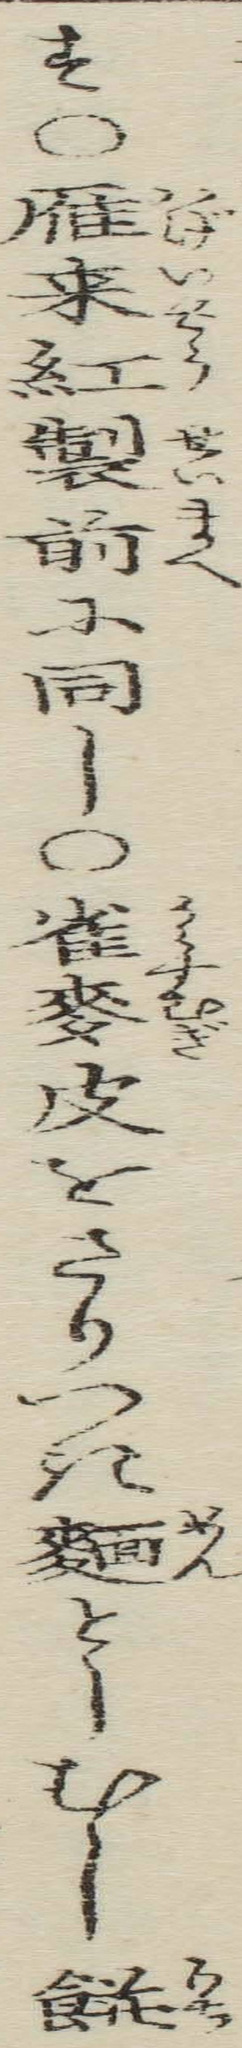す○雁来紅製前に同し○雀麦皮をさりつき麺としむし餅
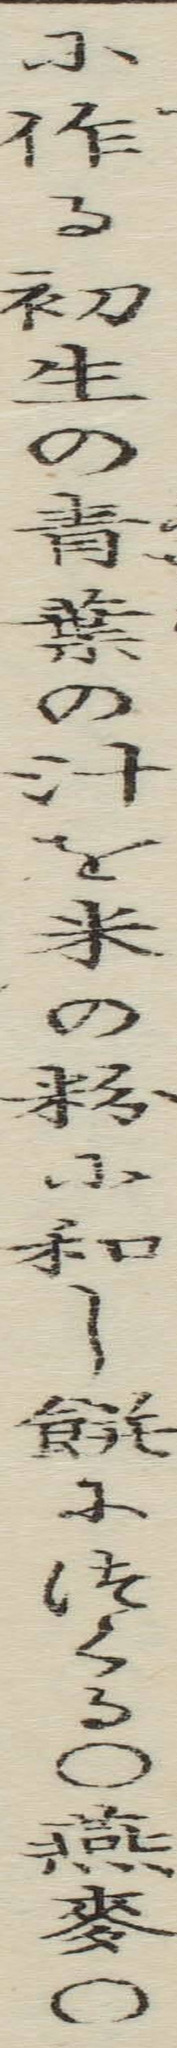に作る初生の青葉の汁を米の粉に和し餅につくる○燕麦○
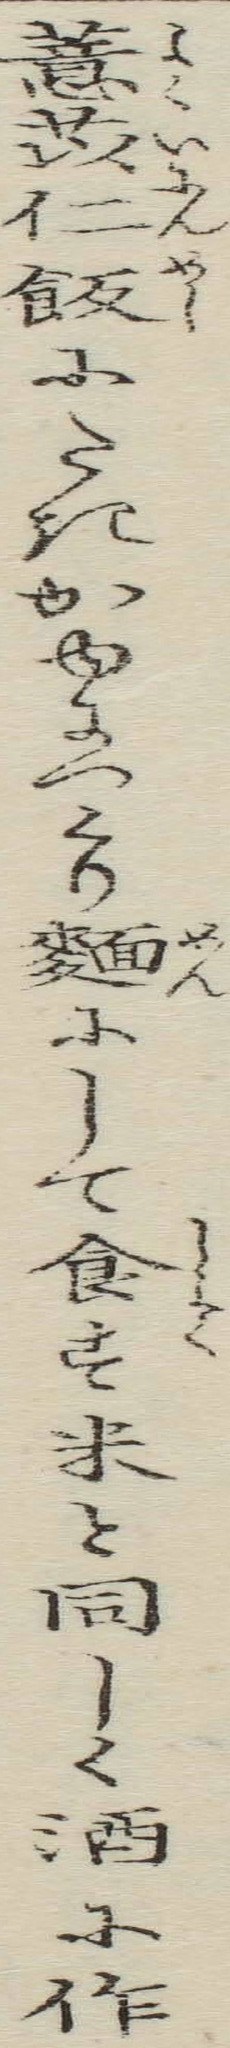薏苡仁飯にたきかゆにつくり麺にして食す米と同しく酒に作
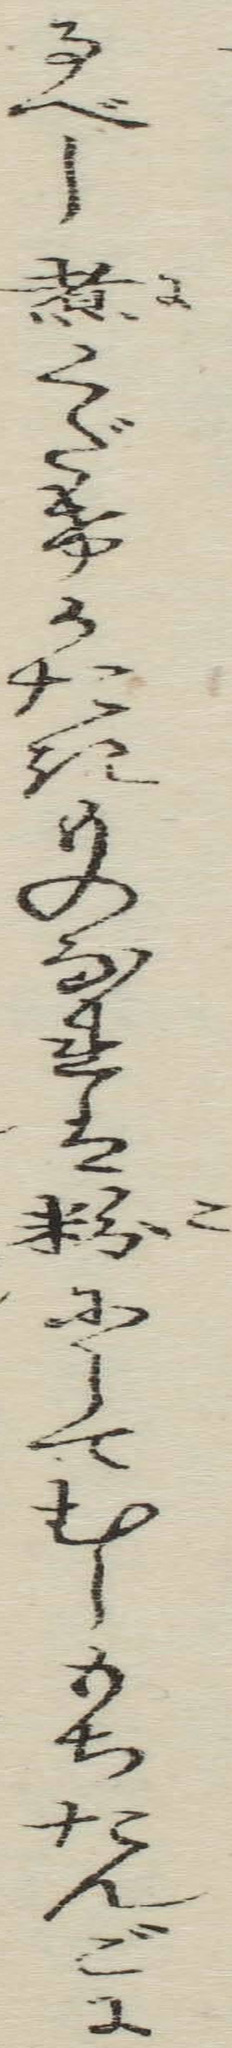るべし煮くだけかたきものなれは粉にしてむしもちたんごに
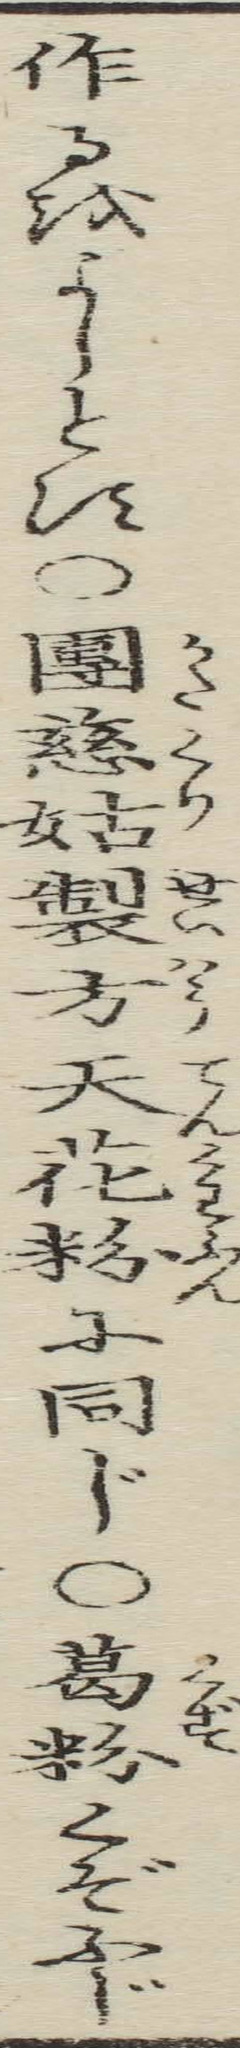作るをよしとす○団慈姑製方天花粉に同じ○葛粉くぞふじ
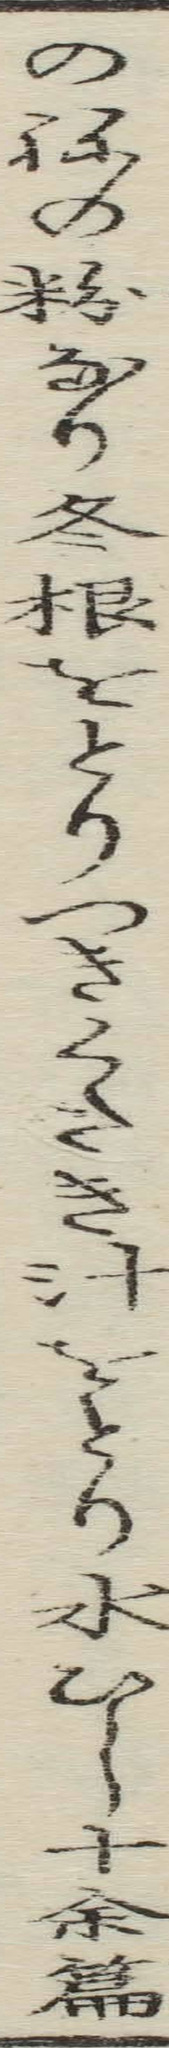のねの粉なり冬根をとりつきくたき汁をとり水ひし十余篇
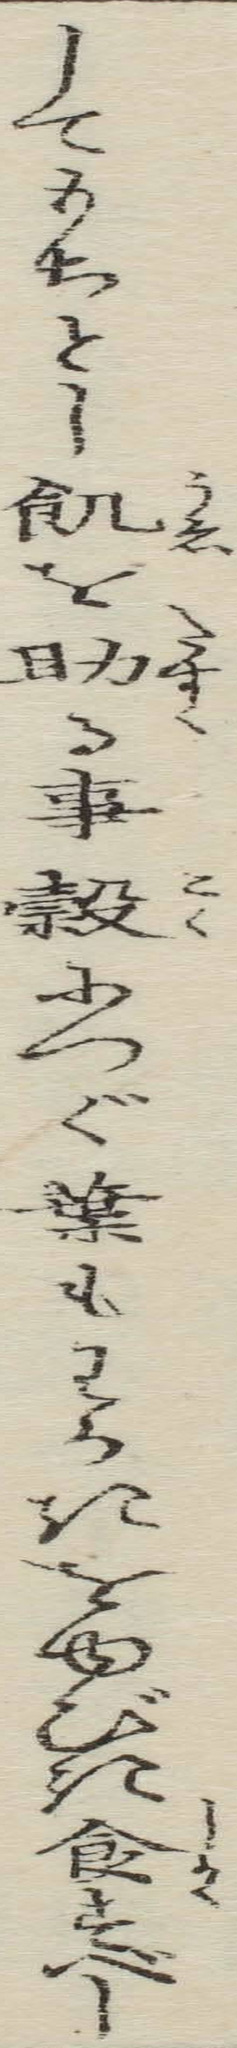してもちとし飢を助る事穀につぐ葉もわかきをゆびき食すべし
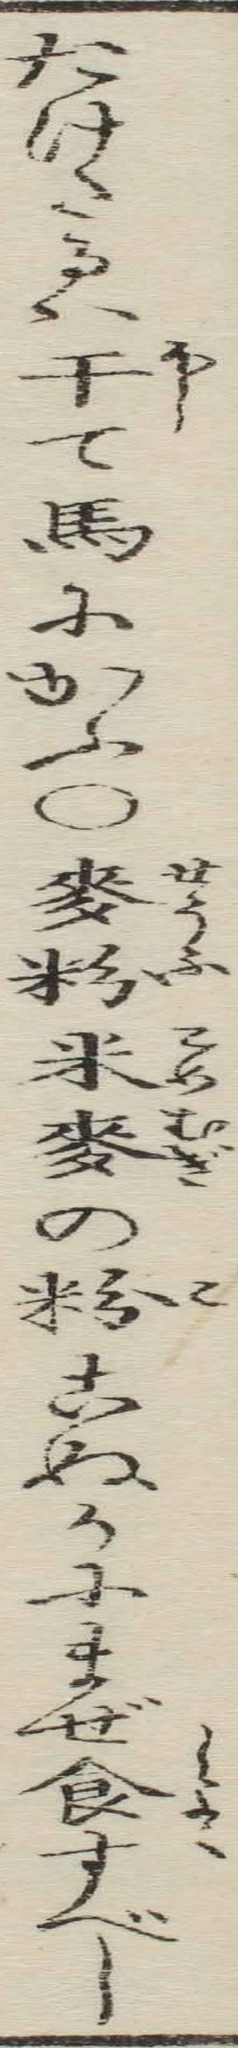たけたるは干て馬にかふ○麦粉米麦の粉こぬかにまぜ食すべし
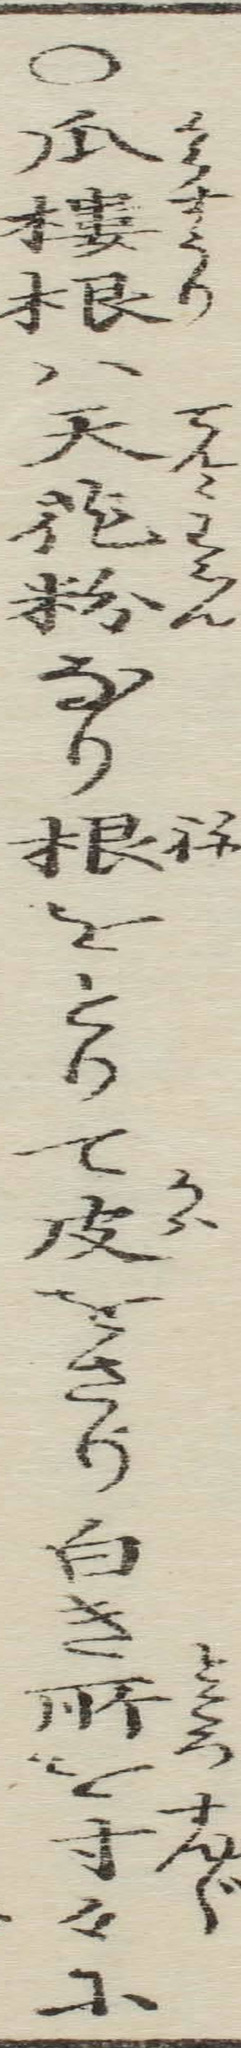○瓜樓根は天花粉なり根をとりて皮をさり白き所を寸々に
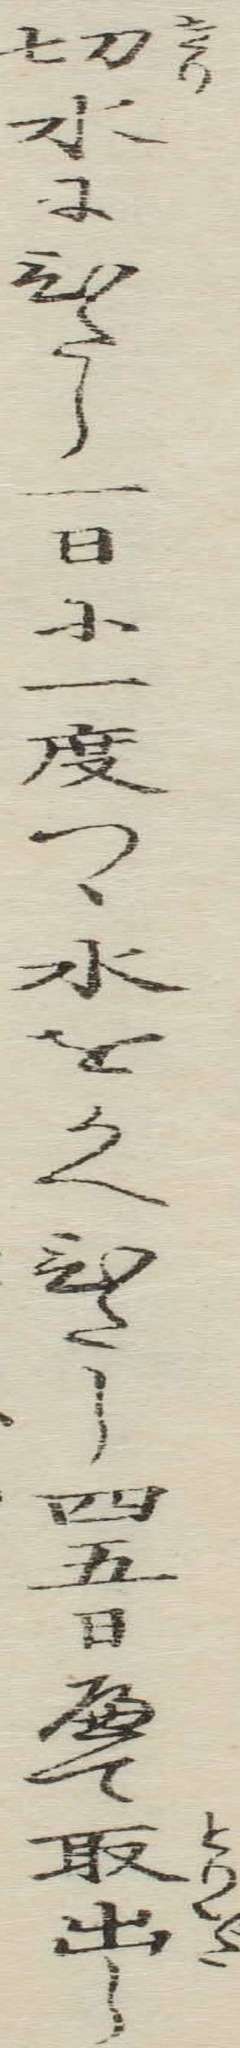切水にひたし一日に一度つゝ水をかへひたし四五日へて取出し
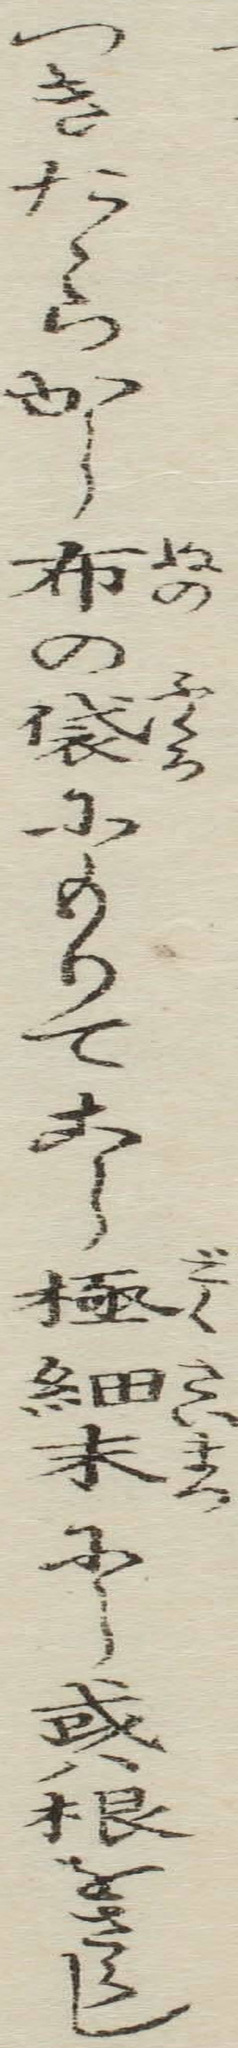つきたゝらかし布の袋にもりてこし極細末にし或は根をさらし
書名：救荒便覧
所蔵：国文学研究資料館
